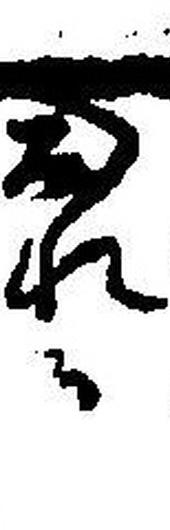おれか
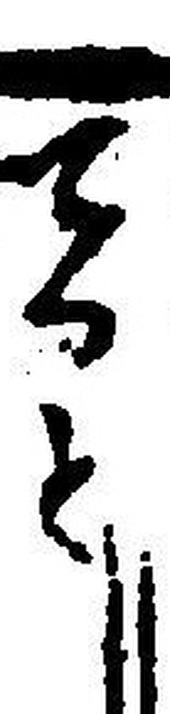てると
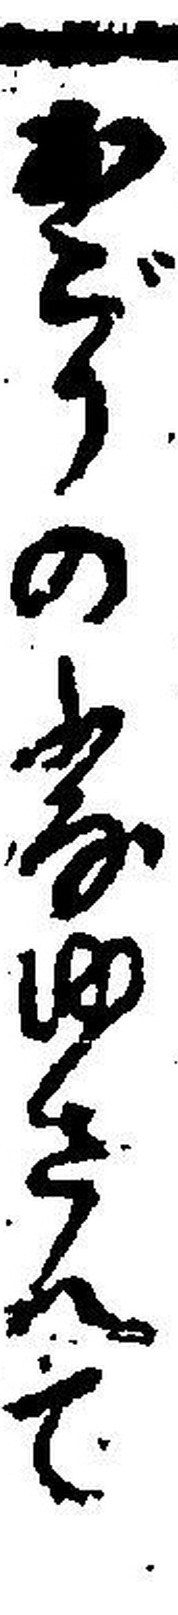おごりのふなゆさんて
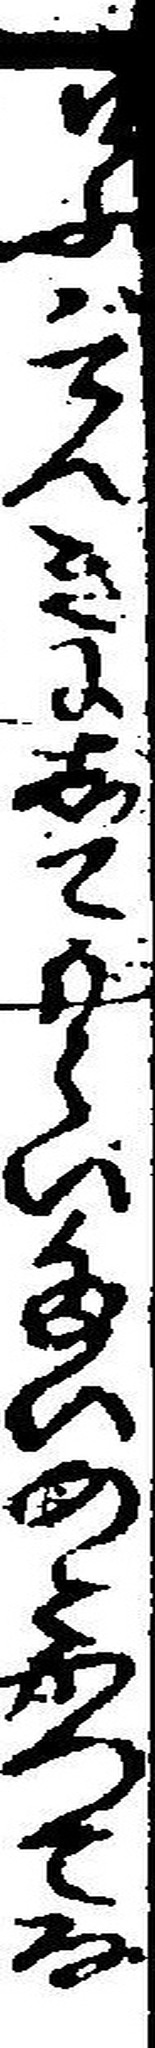けふはてんきにしてもらいたいのとかつてな
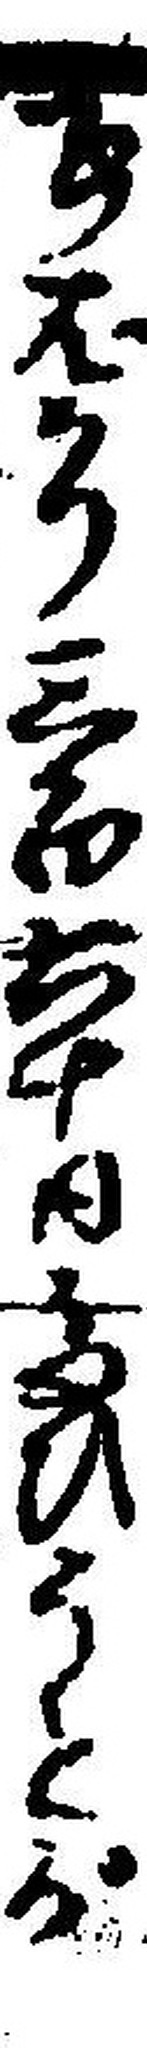事ばかり三百六十日たひうとが
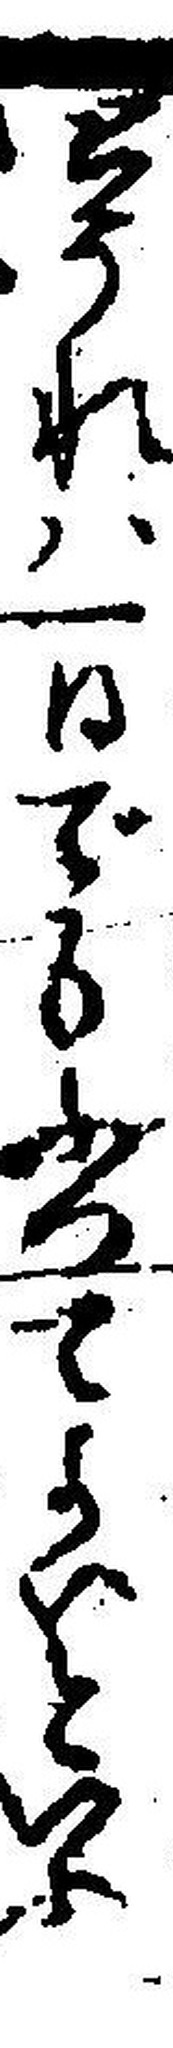とうれは一日でもふつてよいといふ
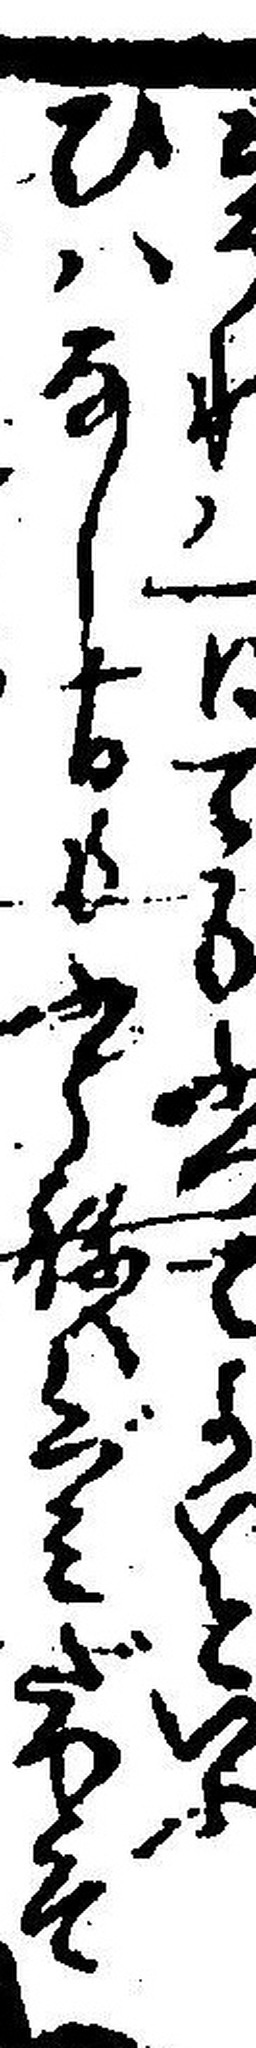ひはなし十日もふらねはごみだつとて
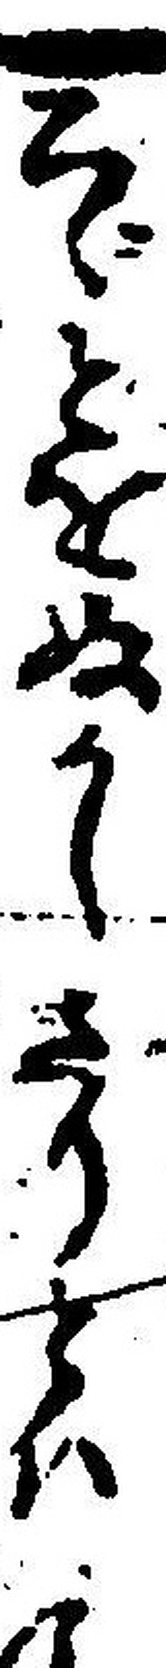こゞとをぬかしさりとは
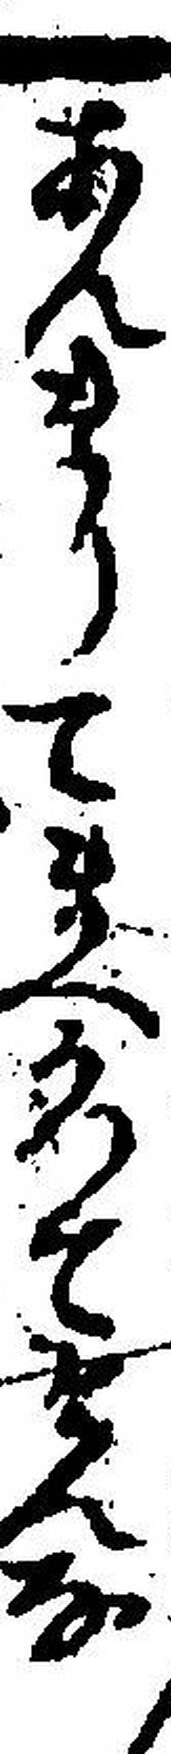あんまりてまへかつてそんな
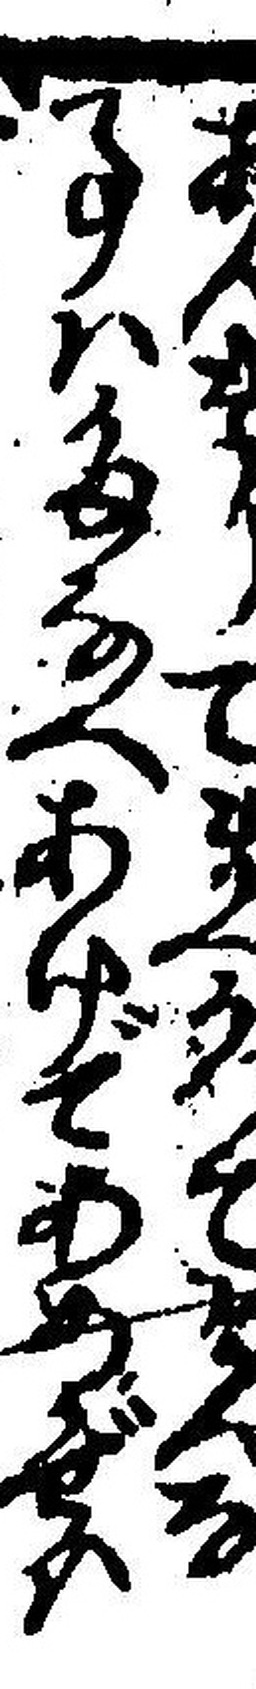事はたなへあげてあめかぜは
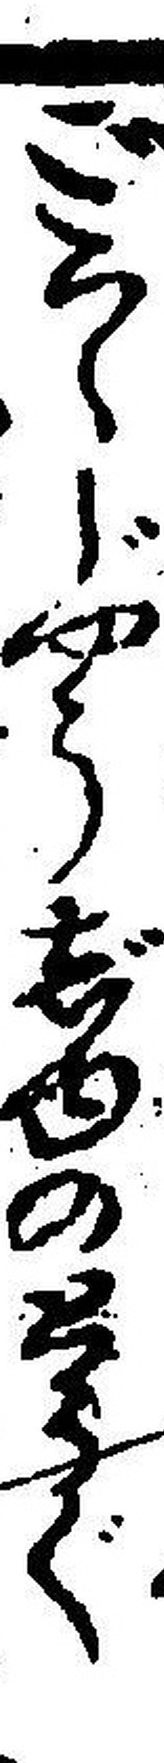ごろうじやうじゆのとうぐ
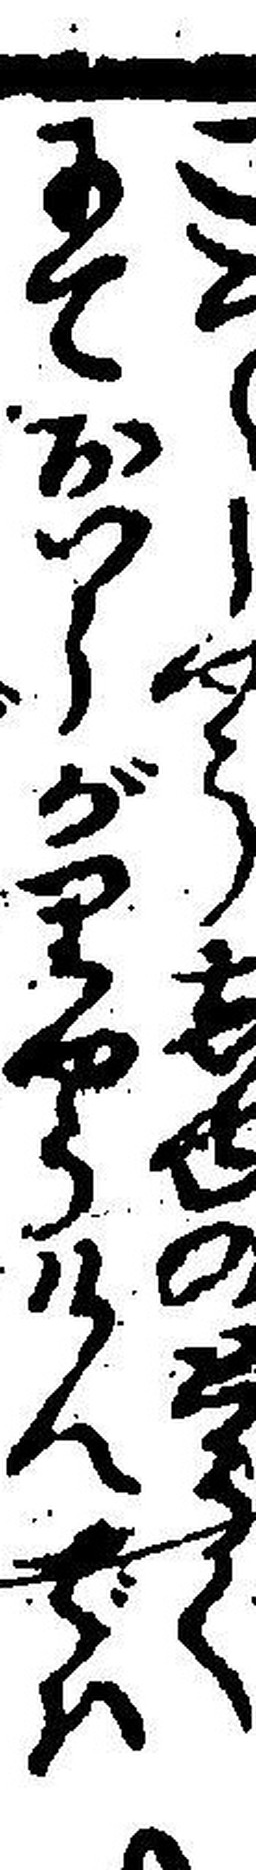にておいらがりやうけんでは
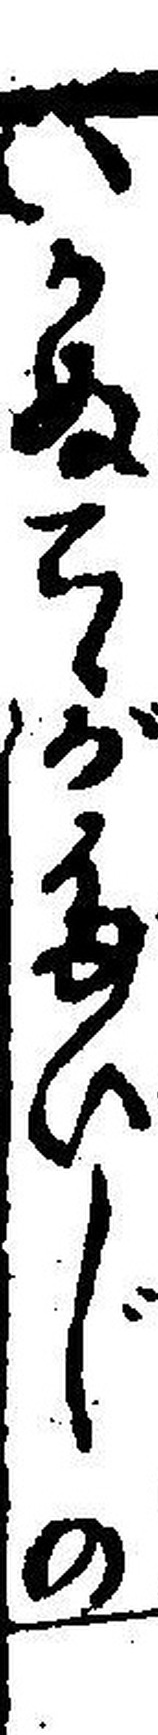いかぬこゝがたいじの
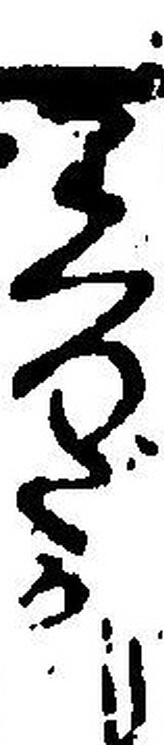りくつだか
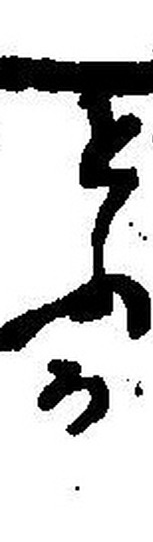どふか
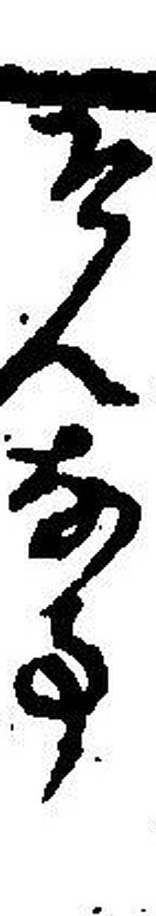そんな事
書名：牡丹餅棚有 / 市場通笑作
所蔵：東京大学総合図書館 General Library in the University of Tokyo, JAPAN
